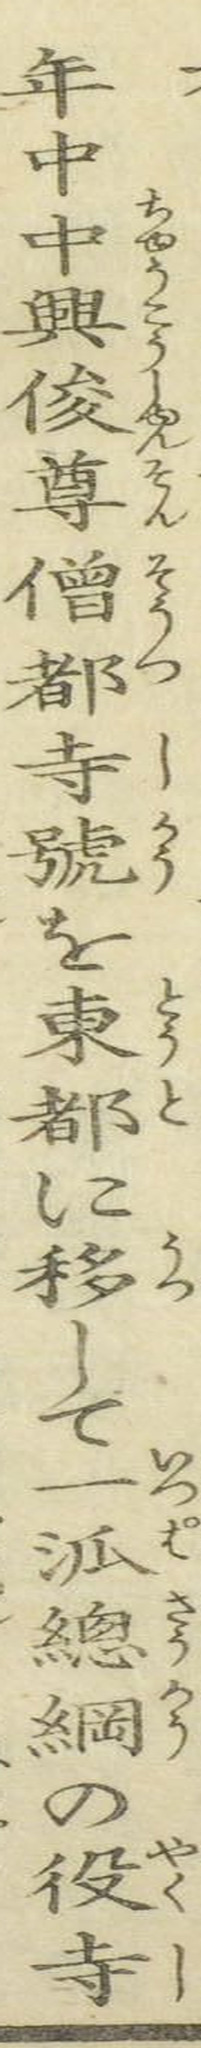年中中興俊尊僧都寺號を東都に移して一派總綱の役寺
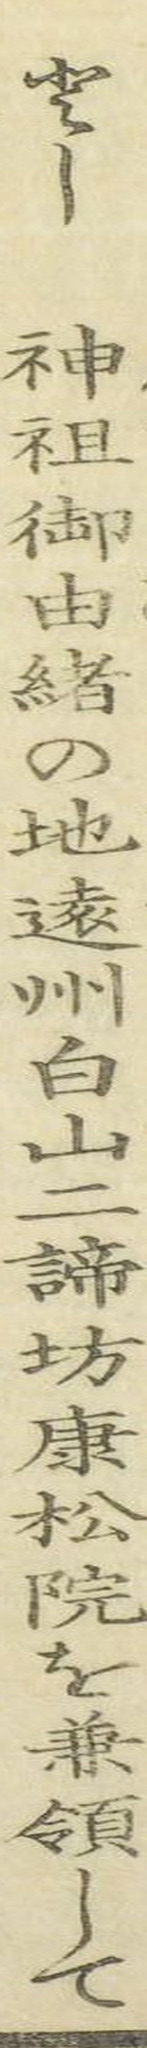とし神祖御由緒の地遠州白山二諦坊康松院を兼領して
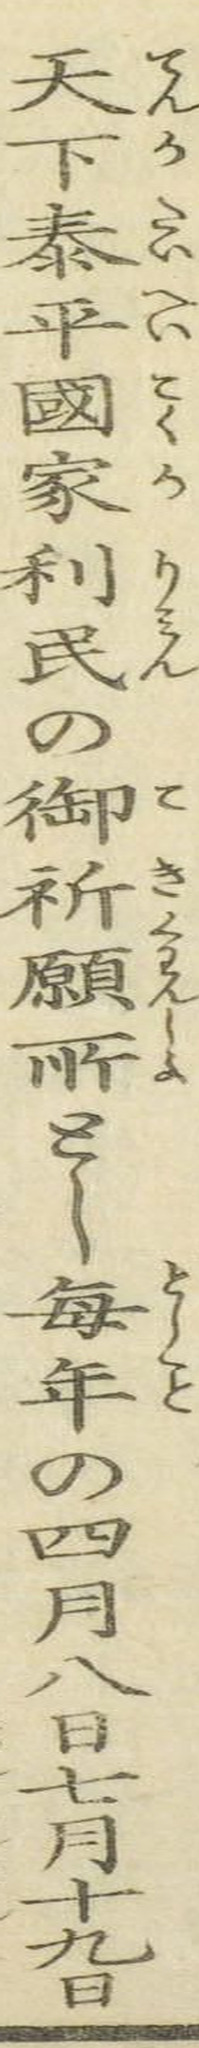天下泰平國家利民の御祈願所とし毎年の四月八日七月十九日
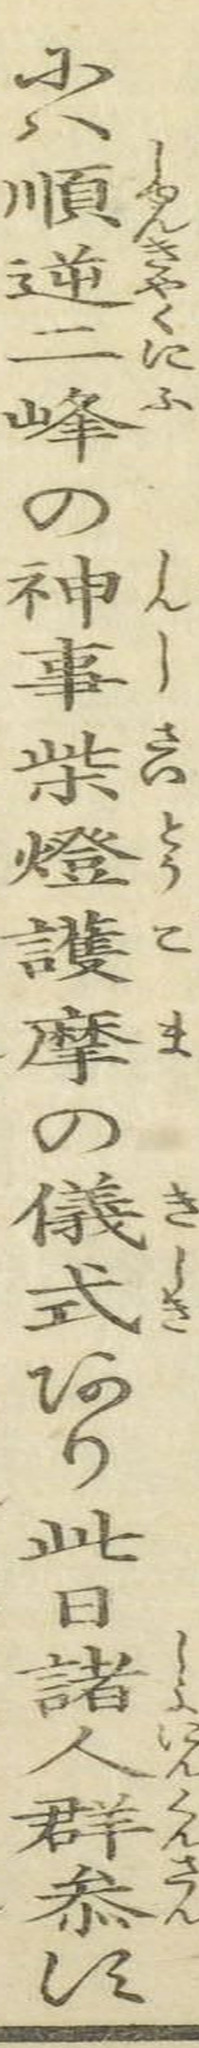には順逆二峰の神事柴燈護摩の儀式あり此日諸人群参す
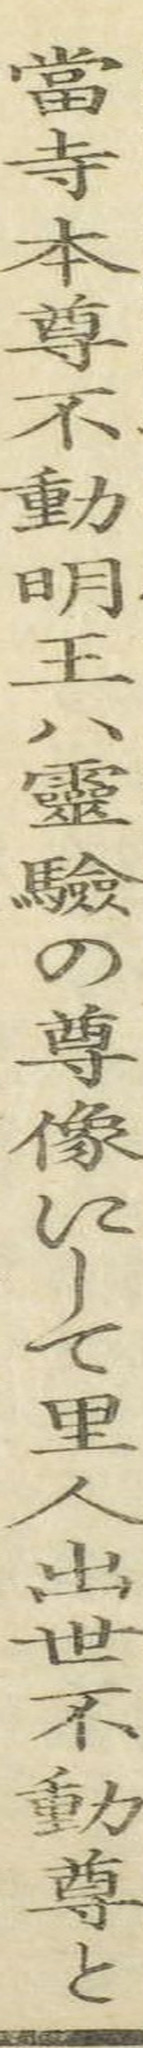當寺本尊不動明王は靈驗の尊像にして里人出世不動尊と
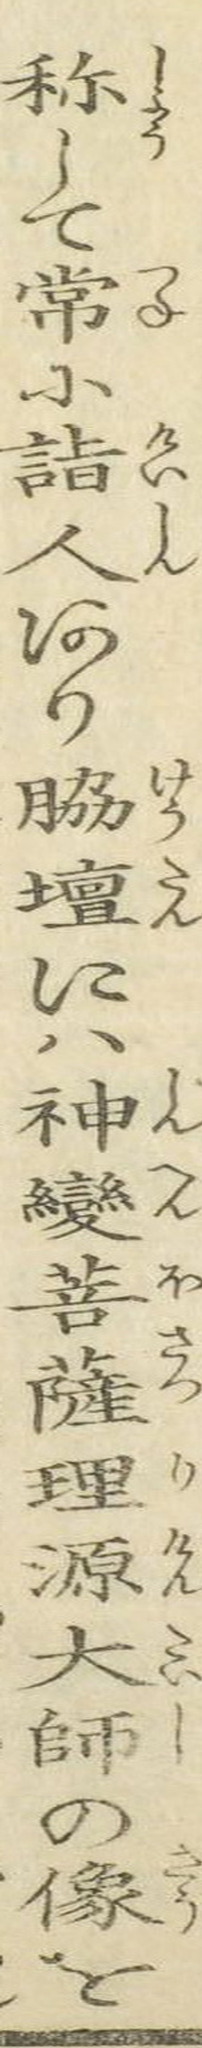称して常に詣人あり脇壇には神變菩薩理源大師の像を
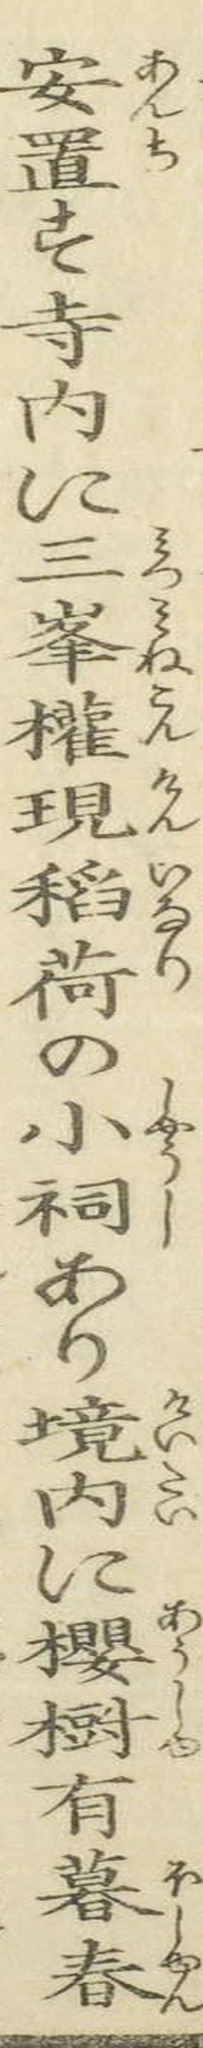安置す寺内に三峯權現稻荷の小祠あり境内に櫻樹有暮春
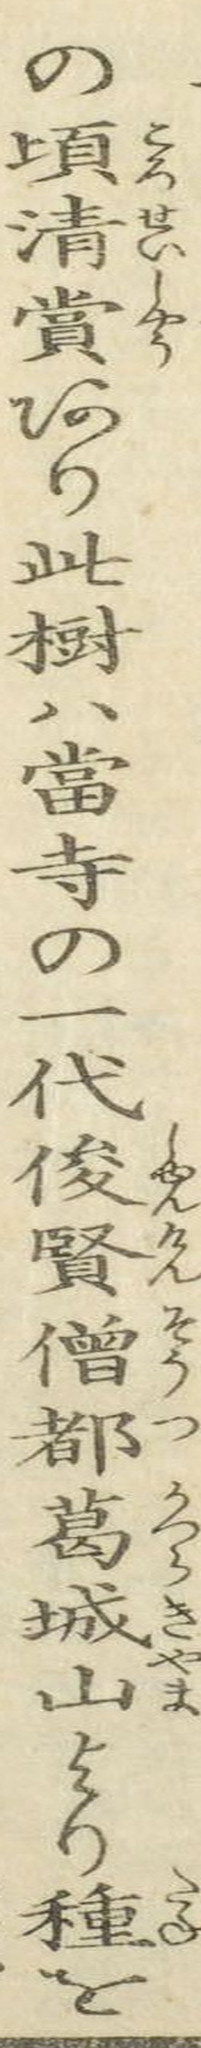の頃清賞あり此樹は當寺の一代俊賢僧都葛城山より種を
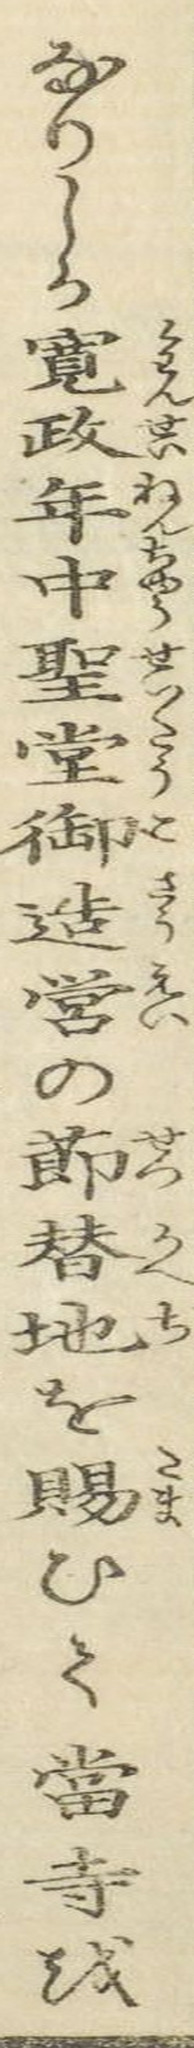なりしか寛政年中聖堂御造営の節替地を賜ひて當寺を
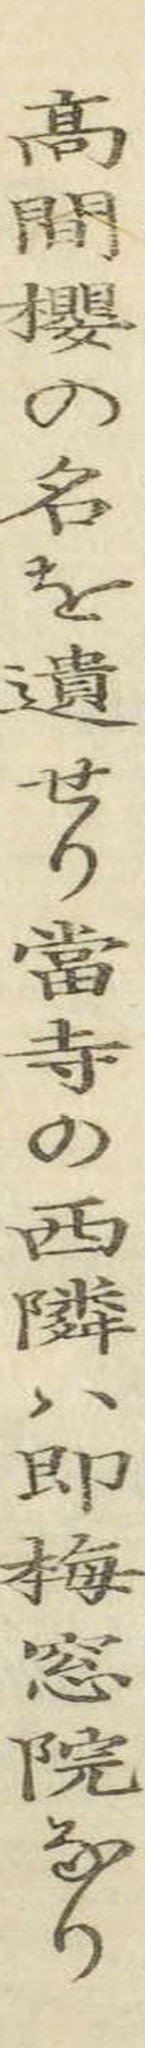髙間櫻の名を遺せり當寺の西隣は即梅窓院なり
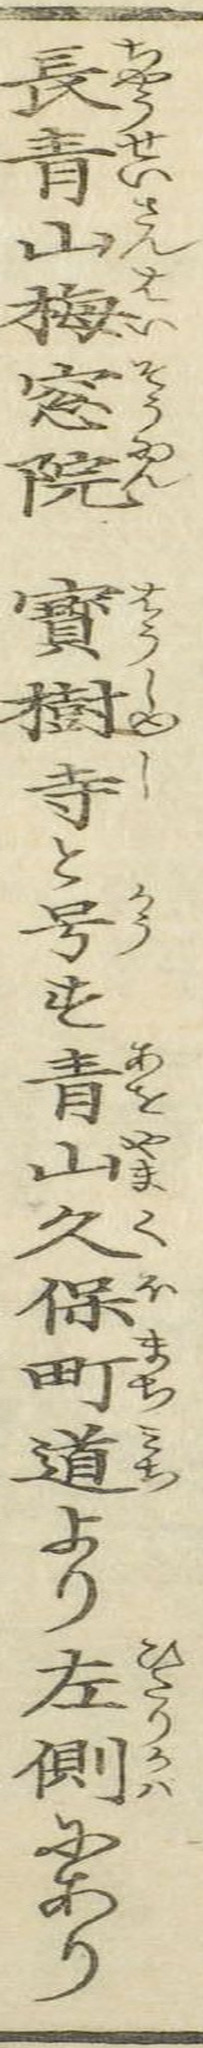長青山梅窓院寳樹寺と号す青山久保町道より左側にあり
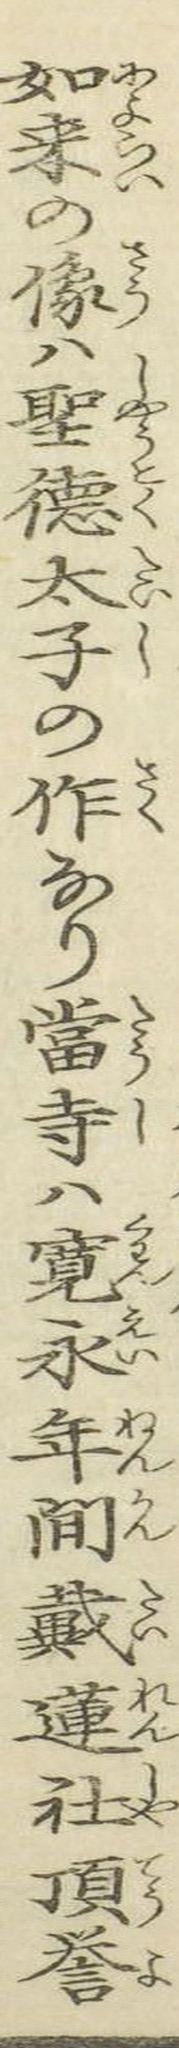如来の像は聖徳太子の作なり當寺は寛永年間載蓮社頂誉

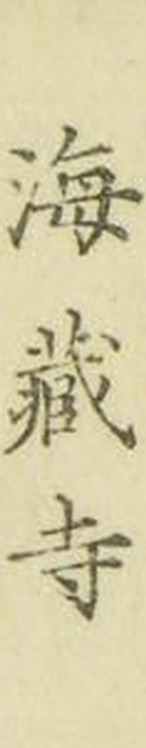海藏寺

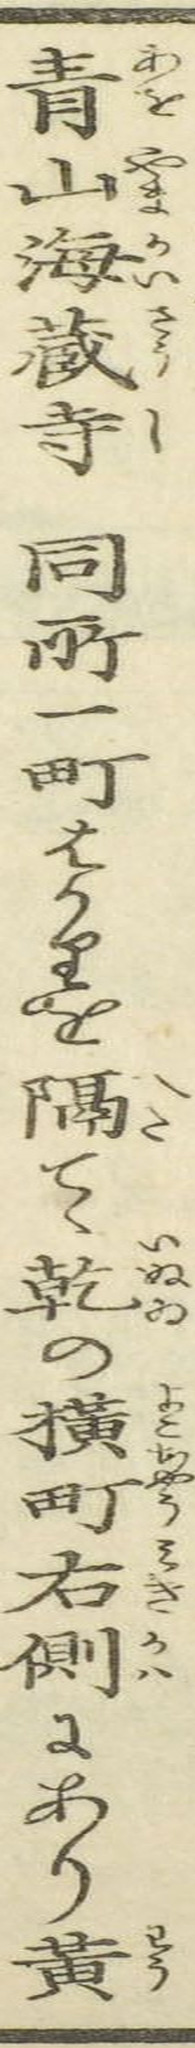青山海藏寺同所一町はかりを隔てゝ乾の横町右側にあり黄
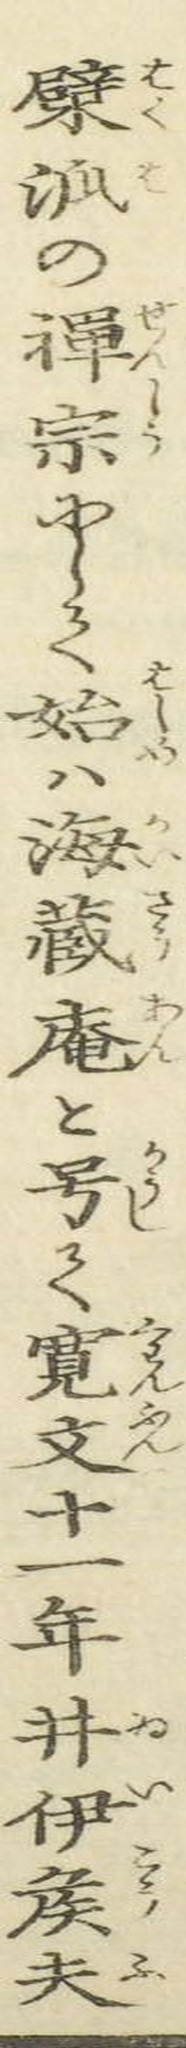檗派の禪宗にして始は海藏庵と号て寛文十一年井伊矦夫
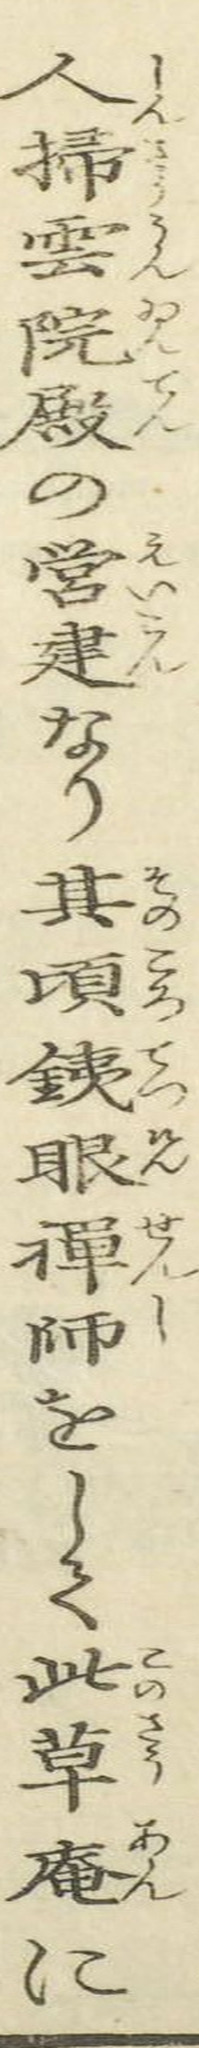人掃雲院殿の営建なり其頃銕眼禪師をして此草庵に
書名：江戸名所図会 20巻 巻之8
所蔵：東京学芸大学教育コンテンツアーカイブ
